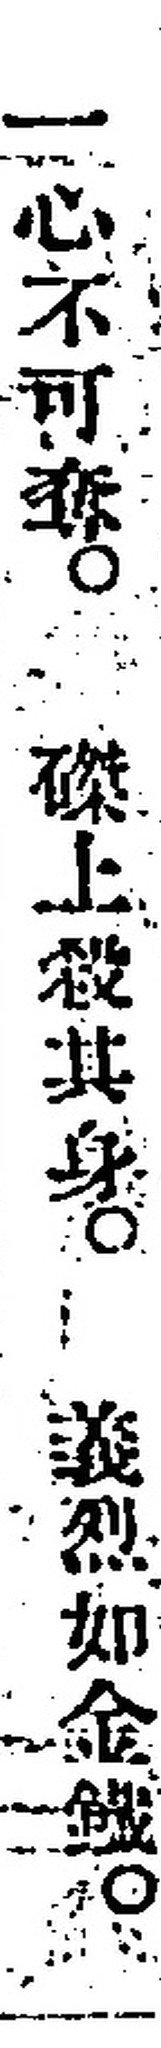一心不可奪。磔上殺其身。義烈如金鉄。
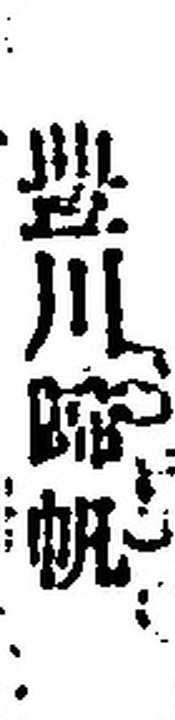豊川帰帆
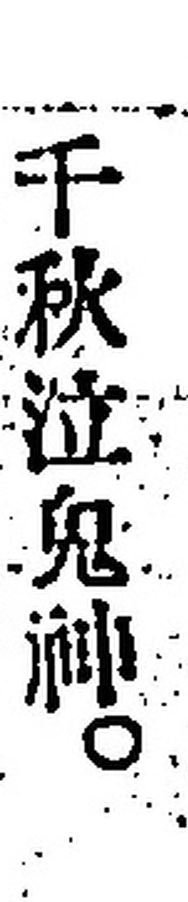千秋泣鬼神。
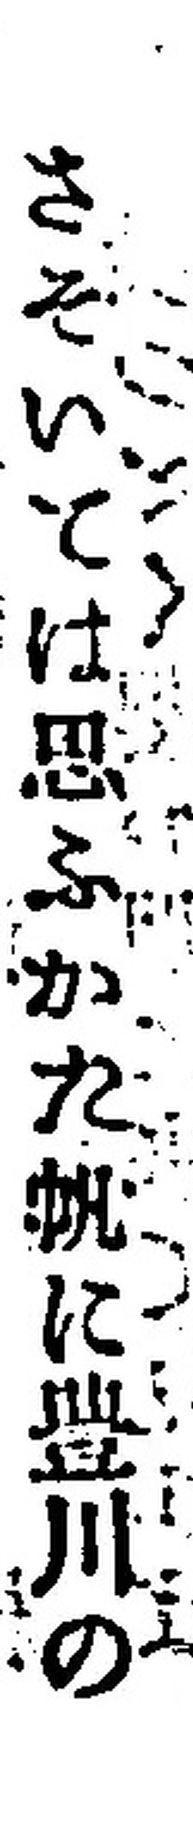さそいては思ふかた帆に豊川の
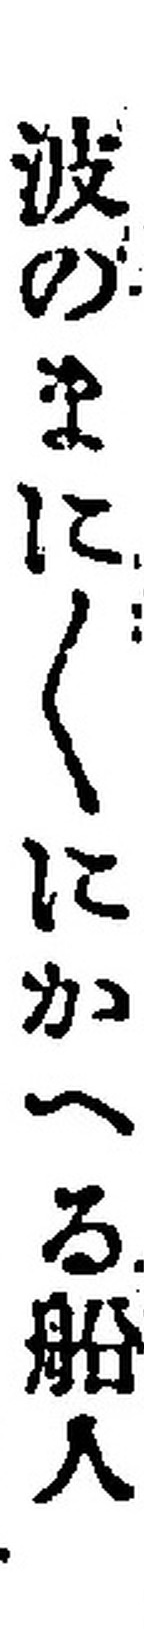波のまに〳〵にかへる船人
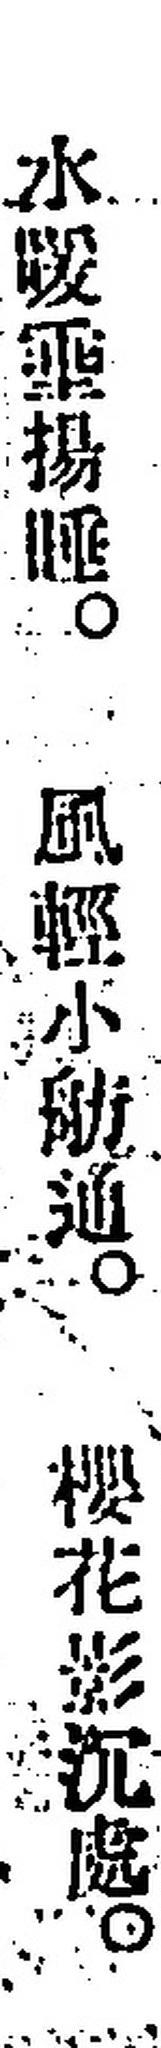水暖垂揚睡。風軽小舫通。桜花影沉処。
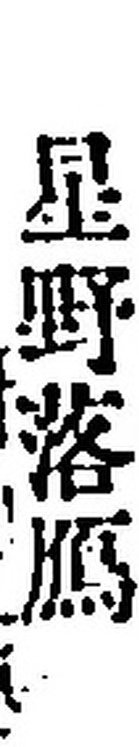星野落鴈
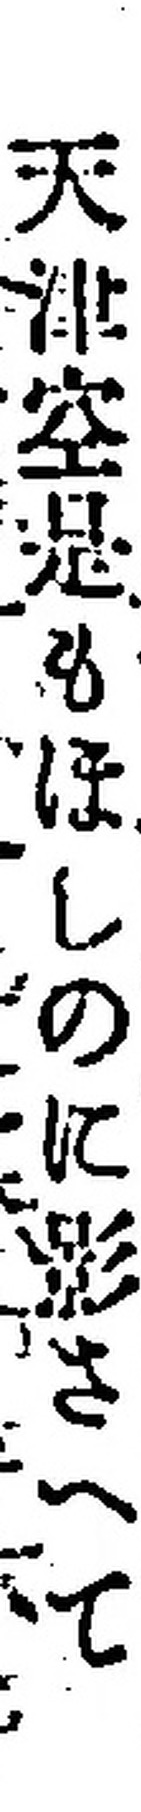天津空是もほしのに影さへて
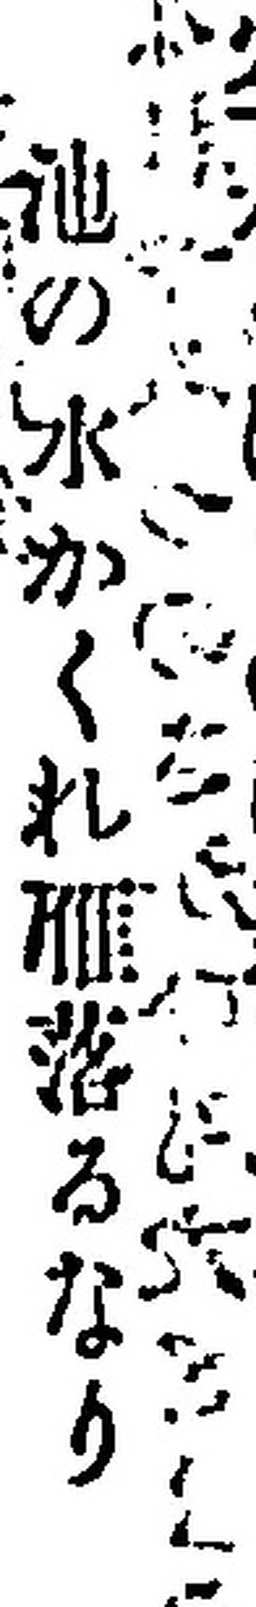池の水かくれ雁落るなり
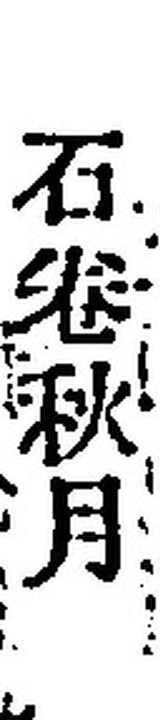石巻秋月
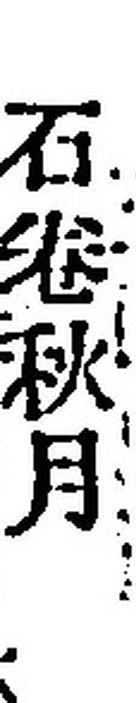石巻秋月
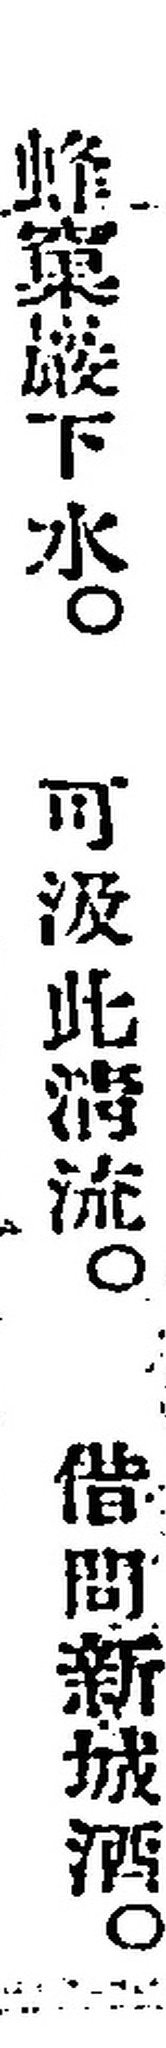蜂窠巌下水。可汲此清流。借問新城酒。
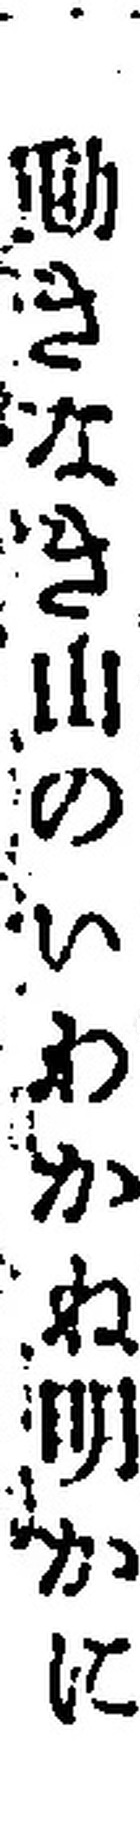動きなき山のいわかね明かに
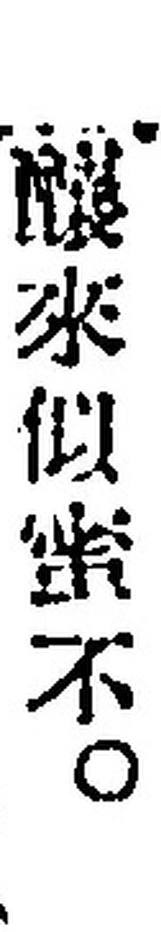醸来似蜜不。
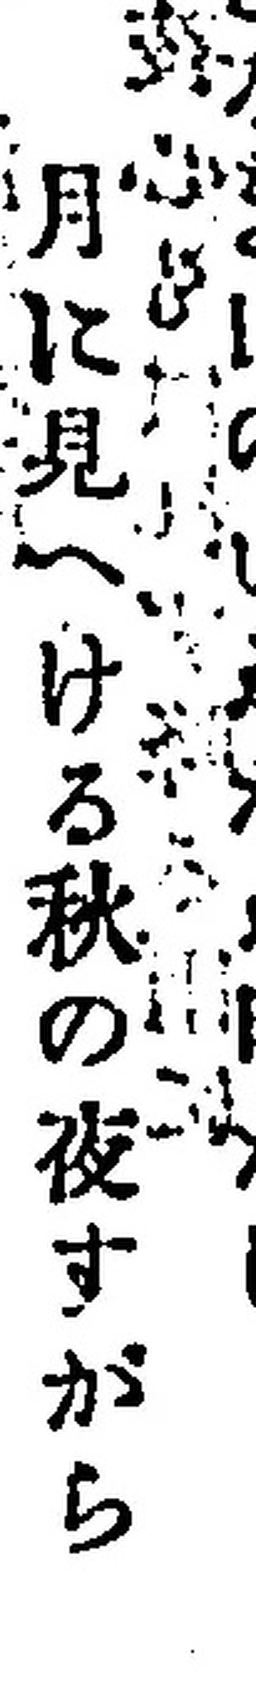月に見へける秋の夜すがら
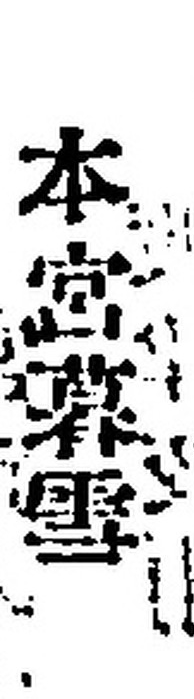本宮暮雪
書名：東参名勝案内
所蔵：国立国会図書館 National Diet Library, JAPAN
